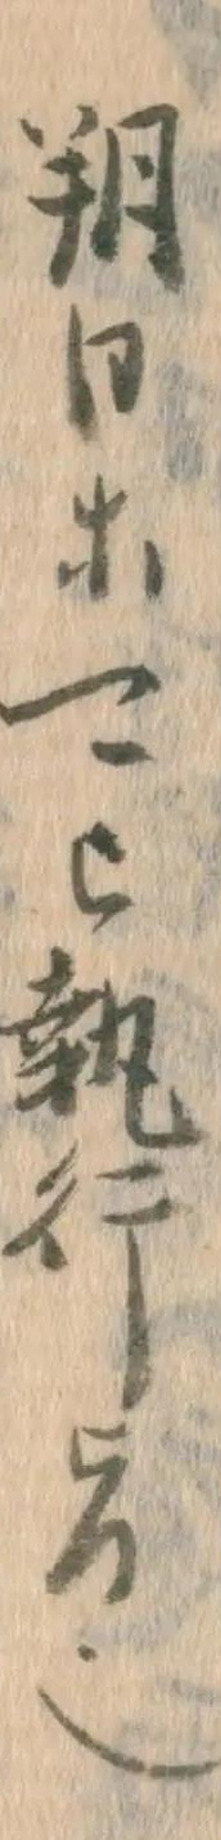朔日等可被執行旨也、
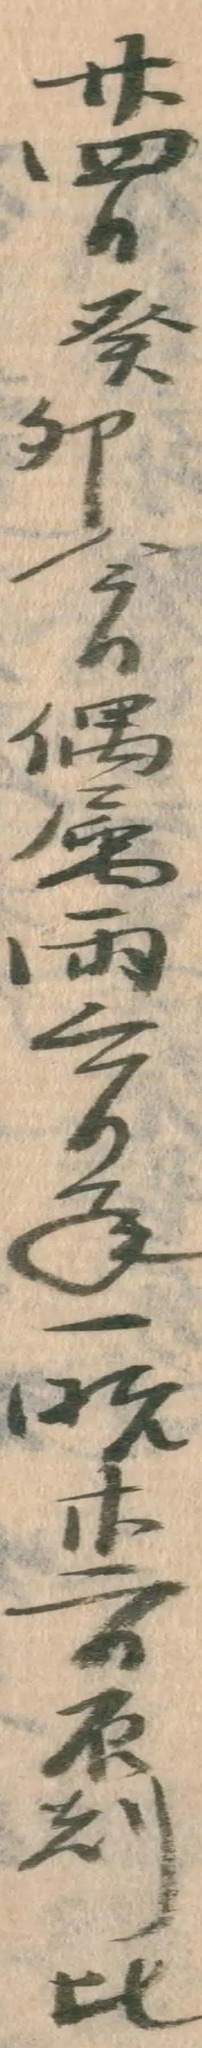廿四日癸卯、今日偶属雨、今日承一昨廿二日辰刻比
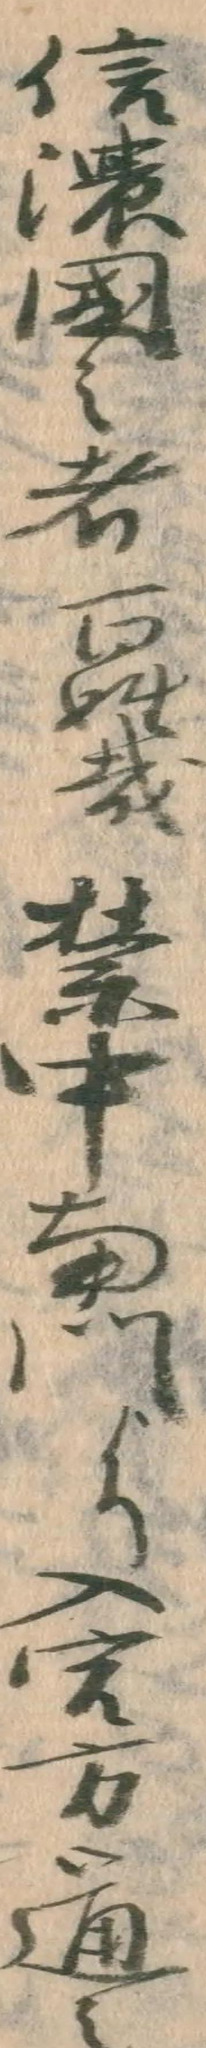信濃国之者百姓哉、禁中南門より入、宮方御通候
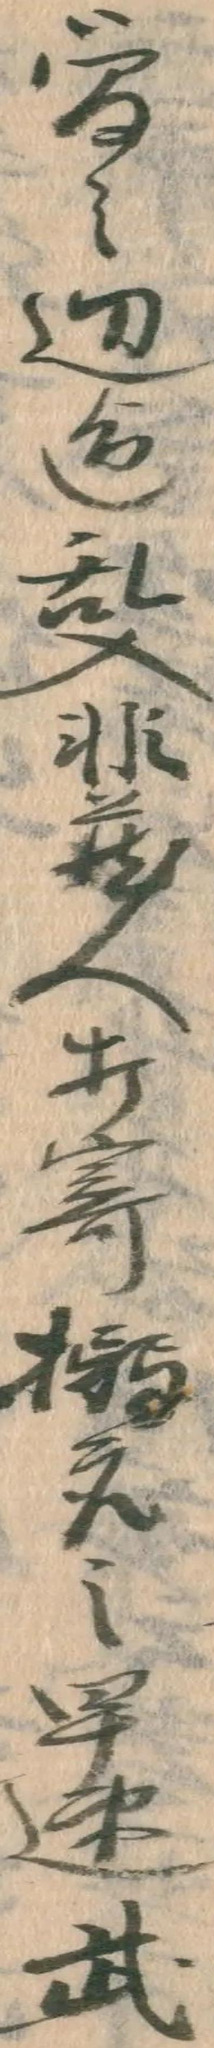御間之辺迄乱入、非蔵人打寄搦取之、早速武
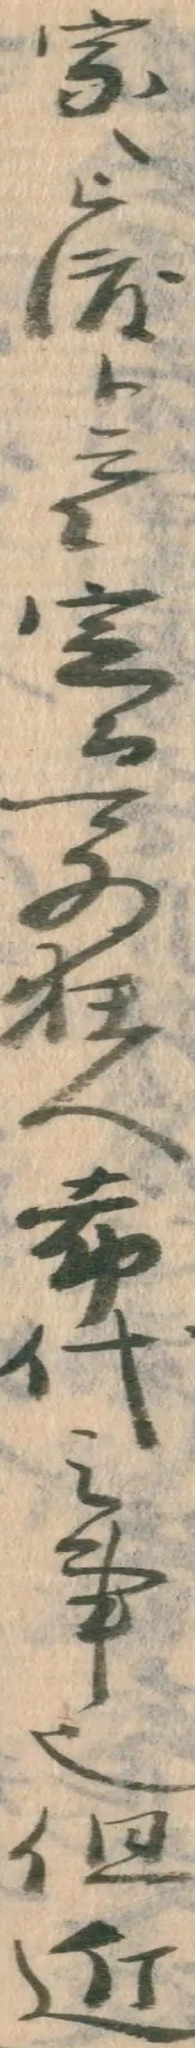家へ被渡候云々、定而可為狂人希代之事也、但近
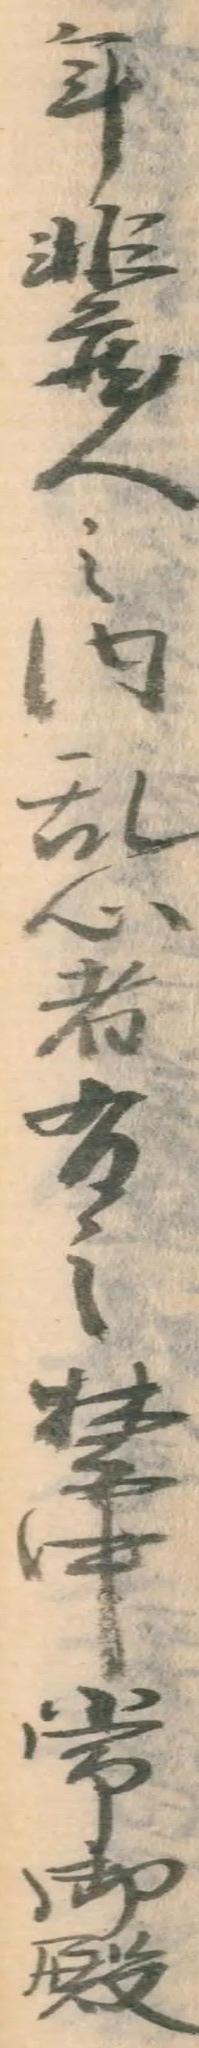計非蔵人之内乱心者有之、禁中常御殿
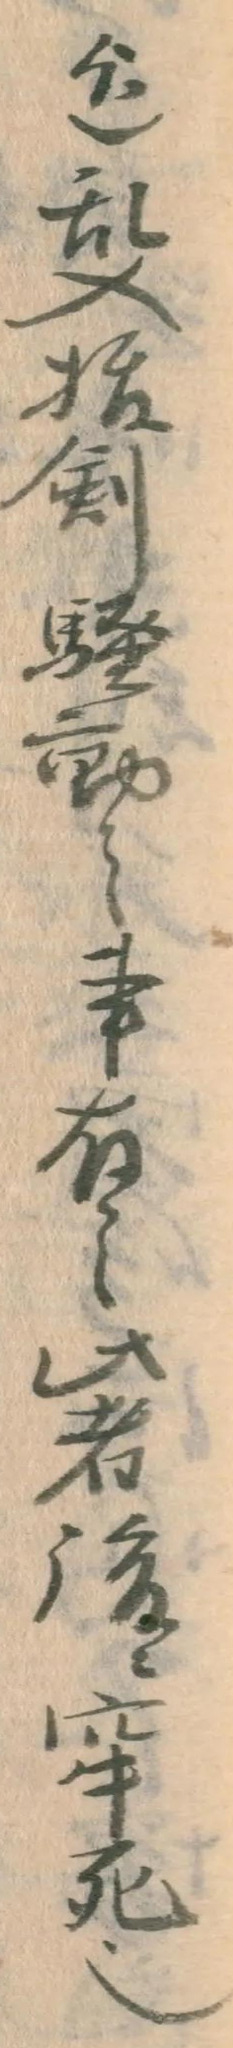迄乱入拾剣騒動之事有之、此者後ニ牢死也、
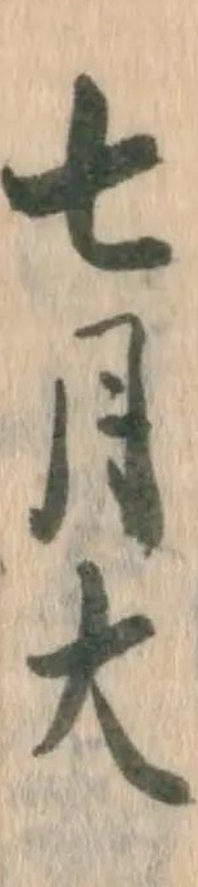七月大
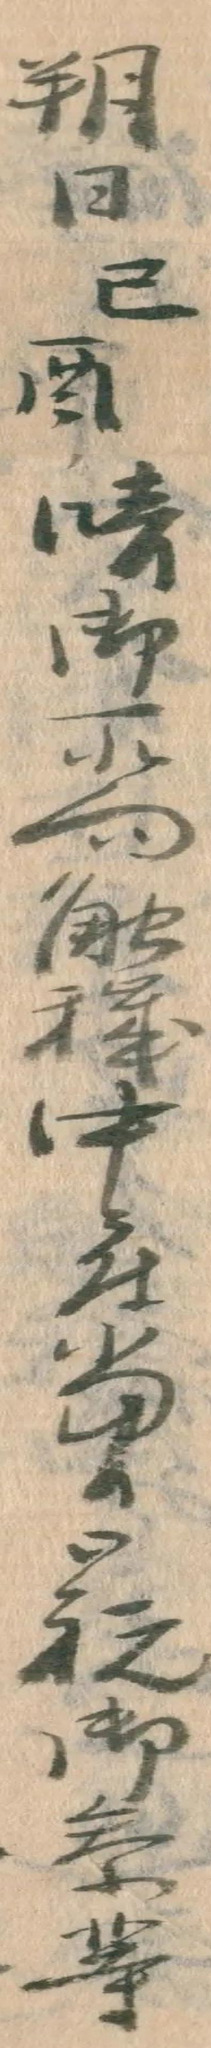朔日己酉晴、御所向触穢中ニ付、當日御祝・御参等
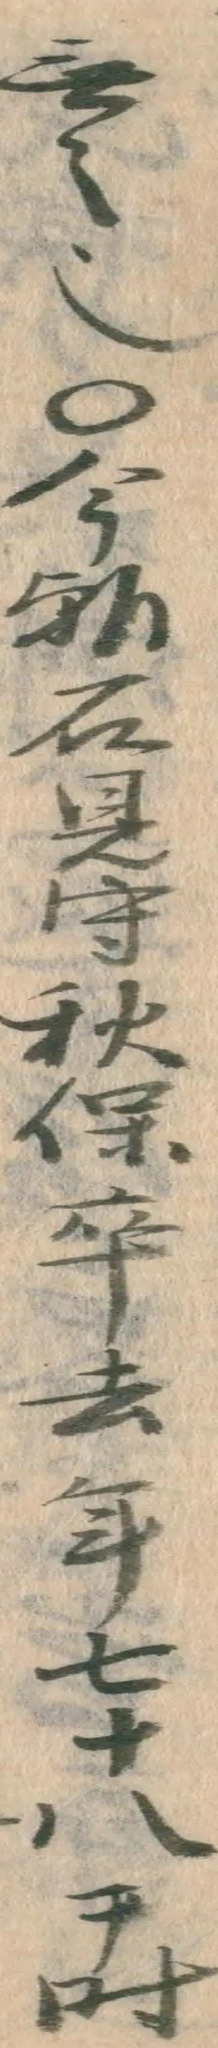無之也、○今朝石見守秋保卒去、年七十八才、時
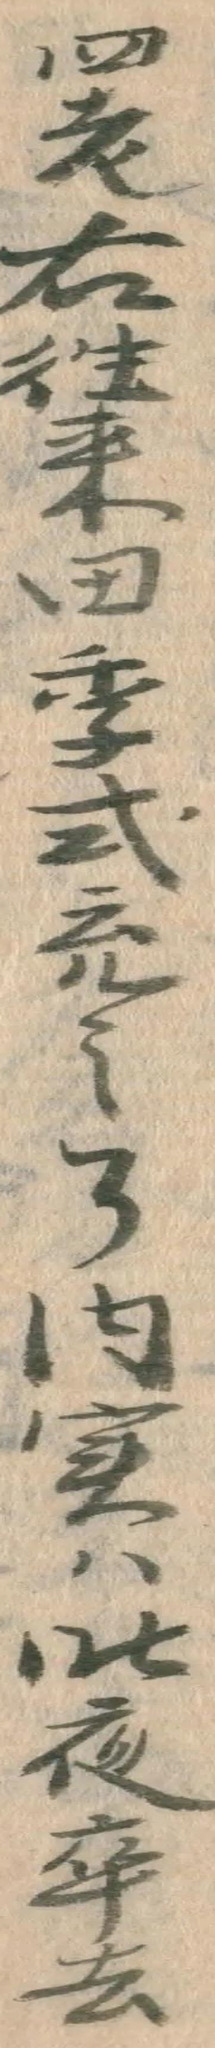四老、右往来田季式充之了、内実ハ昨夜卒去、
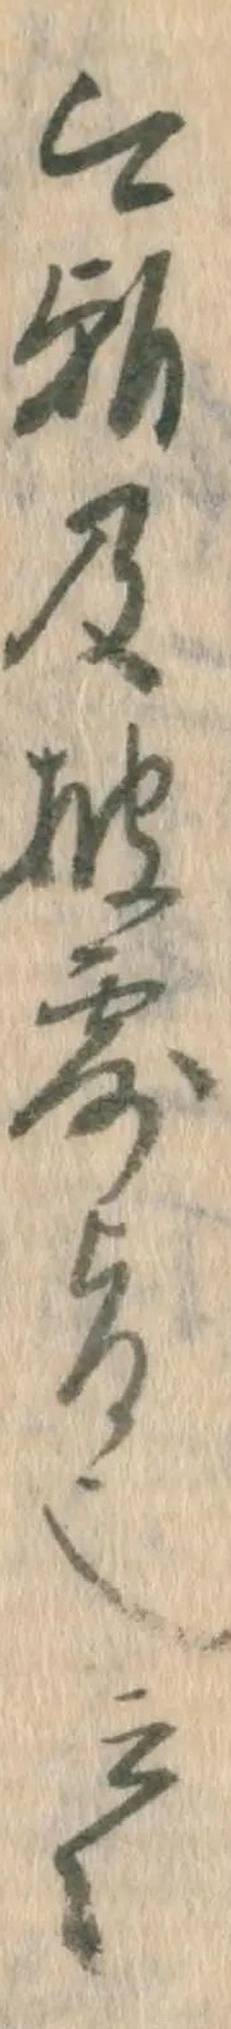今朝及披露旨也云々、
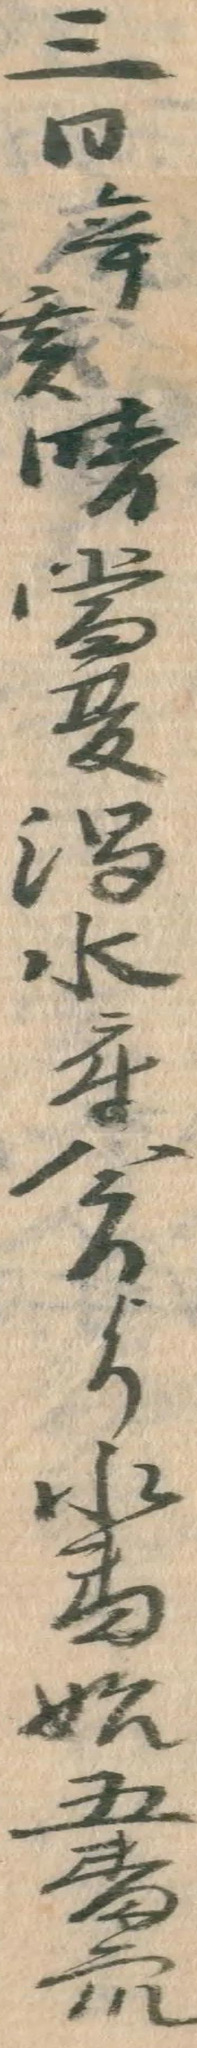三日辛亥晴、當夏渇水ニ付、今日より水番始、五番衆
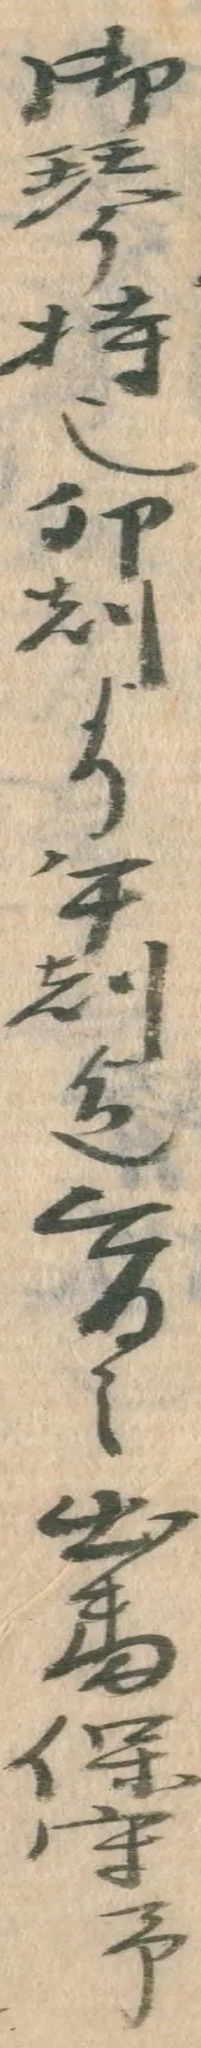御琴持也、卯刻より午刻迄今日之出番保守・予、
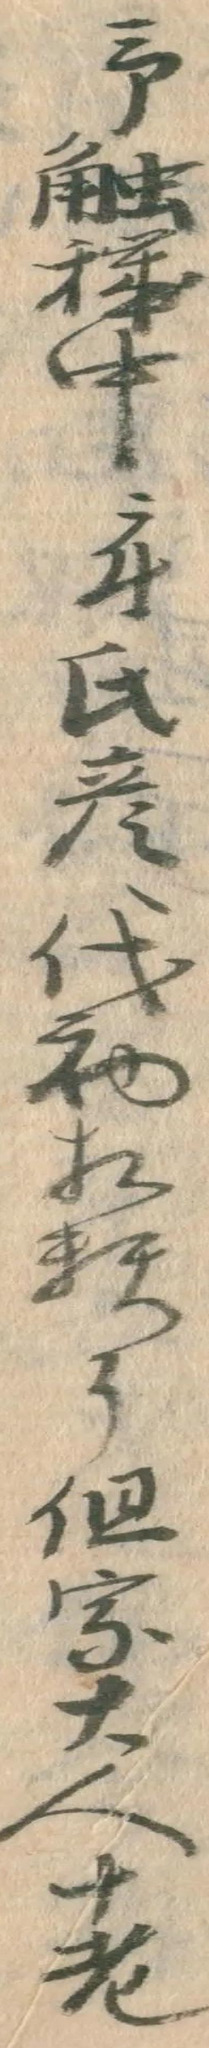予触穢中ニ付、氏彦へ代勤相頼了、但家大人十老
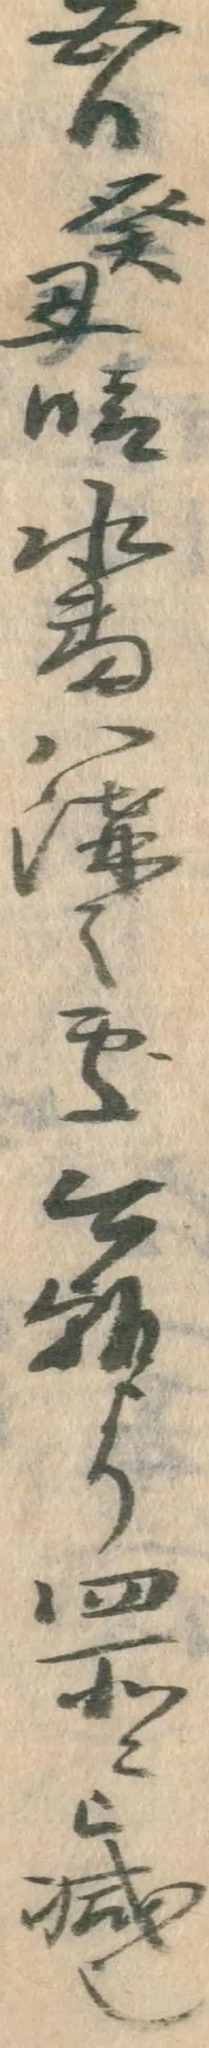五日癸丑晴、水番は溝之處、今朝より四所に被減也、
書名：賀茂社記録. 第63冊
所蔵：国立国会図書館 National Diet Library, JAPAN
